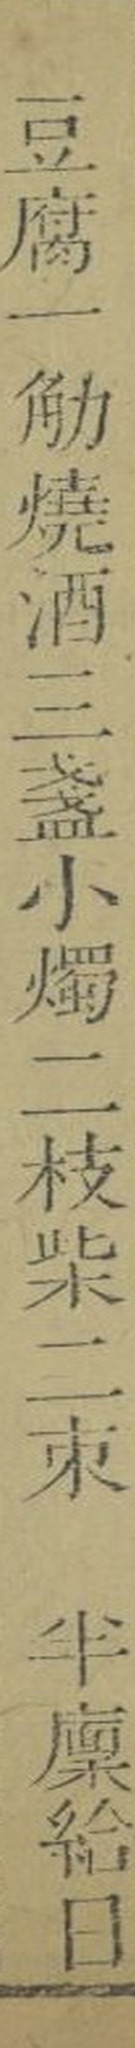豆腐一觔燒酒三盞小燭二枝柴二束半廩給日
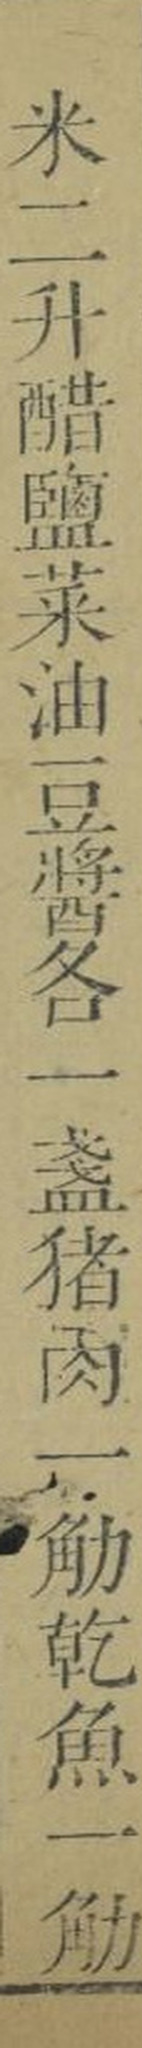米二升醋鹽菜油豆醬各一盞猪肉一觔乾魚一觔
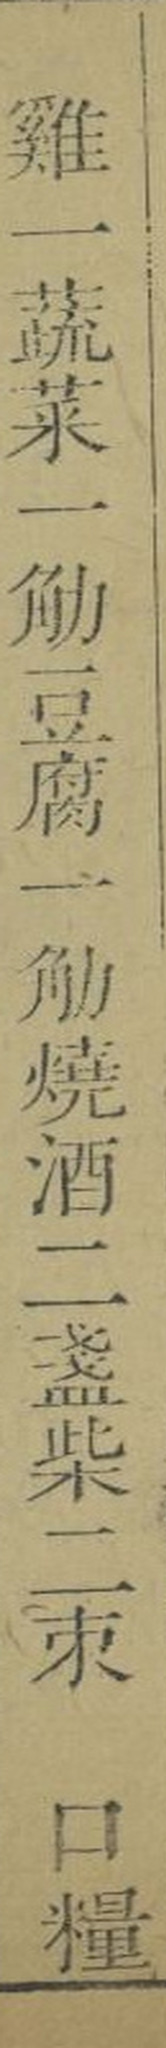雞一蔬菜一觔豆腐一觔燒酒二盞柴二束口糧
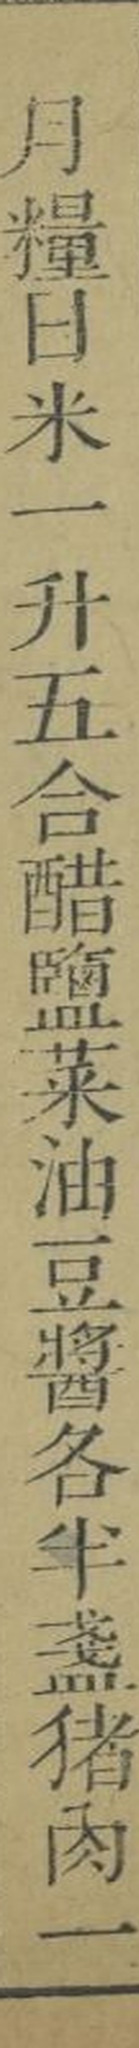月糧日米一升五合醋鹽菜油豆醬各半盞猪肉一
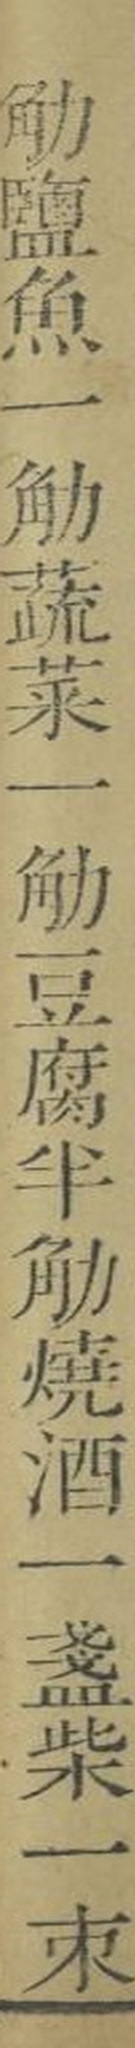觔鹽魚一觔蔬菜一觔豆腐半觔燒酒一盞柴一束
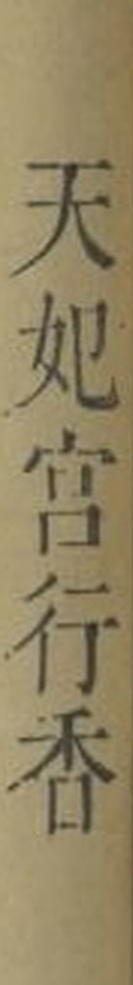天妃宫行香
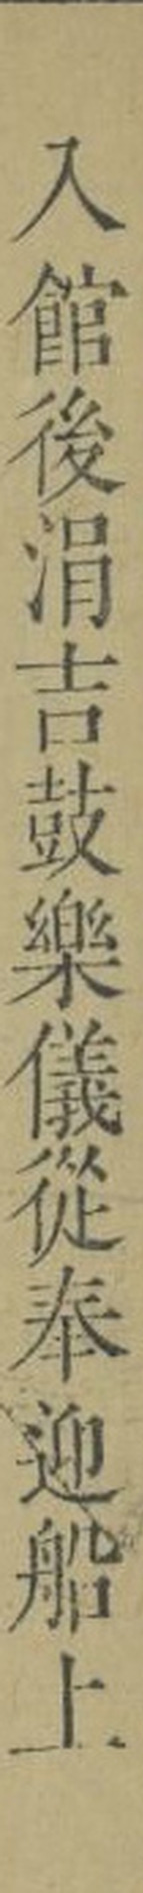入館後涓吉鼓樂儀從奉迎船上
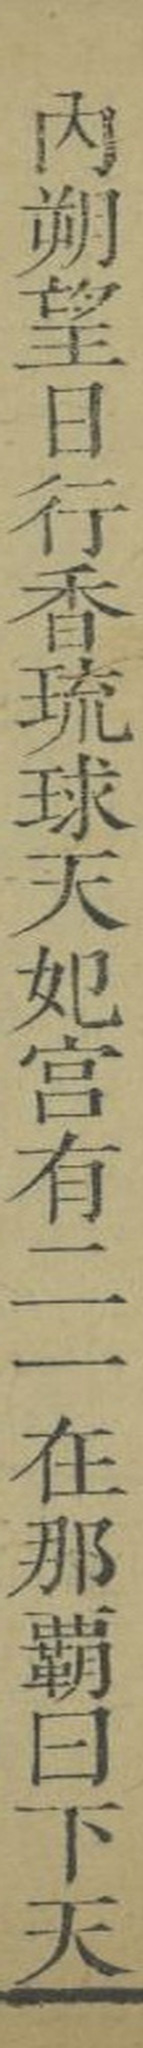内朔望日行香琉球天妃宫有二一在那覇曰下天
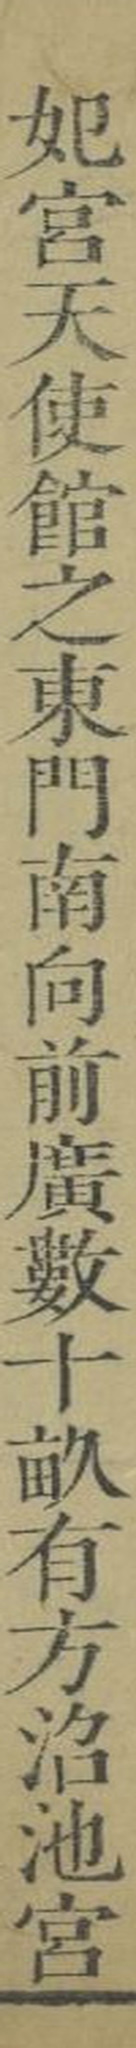妃宮天使館之東門南向前廣數十畝有方沼池宮
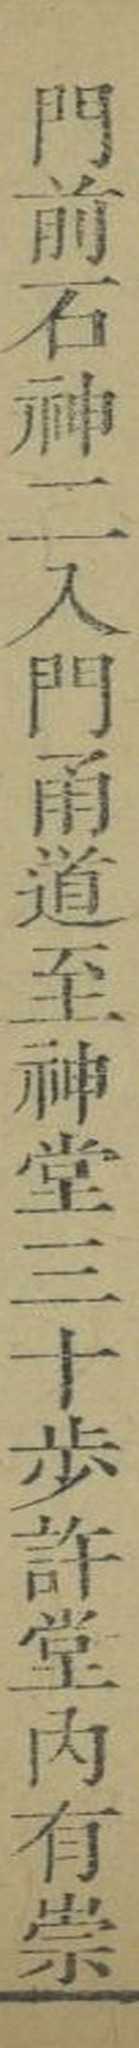門前石神二入門甬道至神堂三十歩許堂内有崇
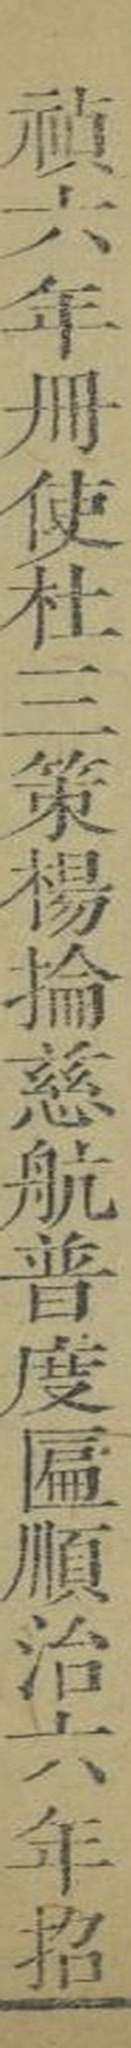禎六年冊使杜三策楊掄慈航普度匾順治六年招
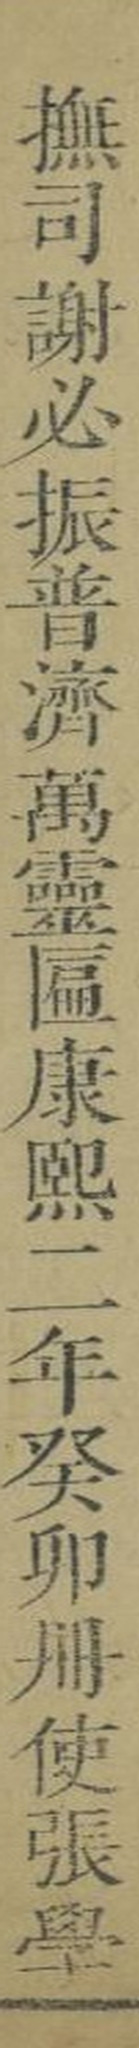撫司謝必振普濟萬靈匾康煕二年癸卯冊使張學
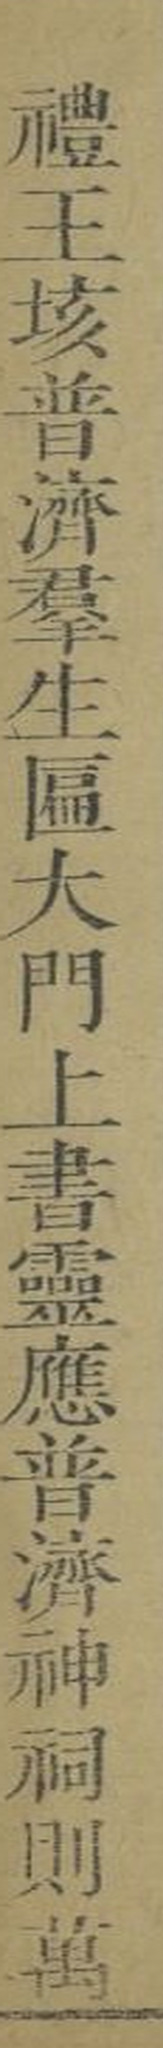禮王垓普濟羣生匾大門上書靈應普濟神祠則萬

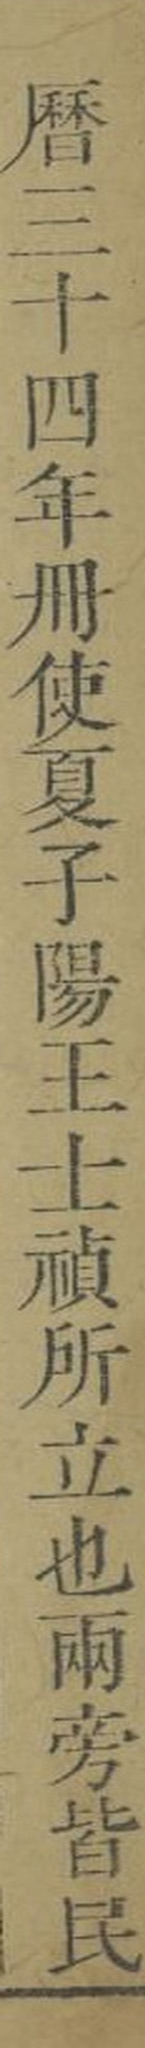曆三十四年冊使夏子陽王士禎所立也兩旁皆民
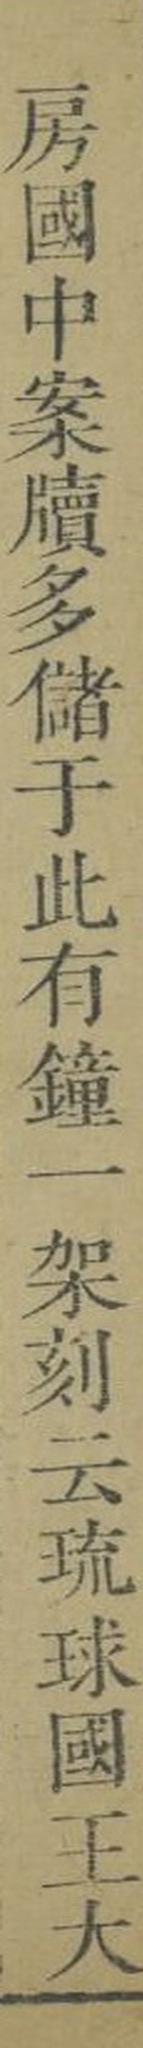房國中案牘多儲于此有鐘一架刻云琉球國王大
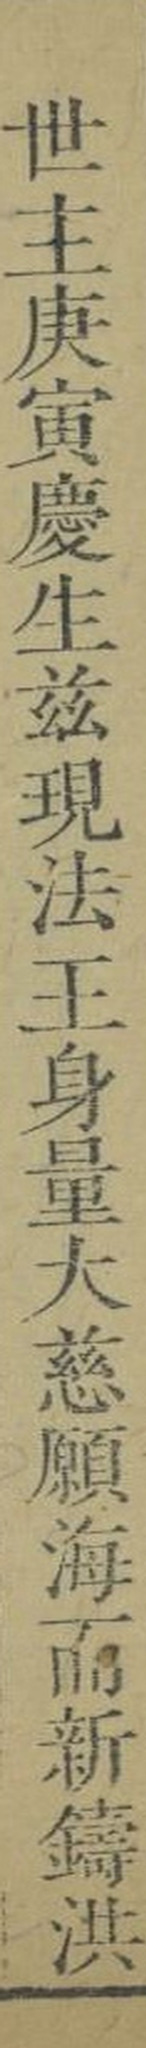世主庚寅慶生茲現法王身量大慈願海而新鑄洪
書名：中山伝信録 巻二
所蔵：University of the Ryukyus Library
